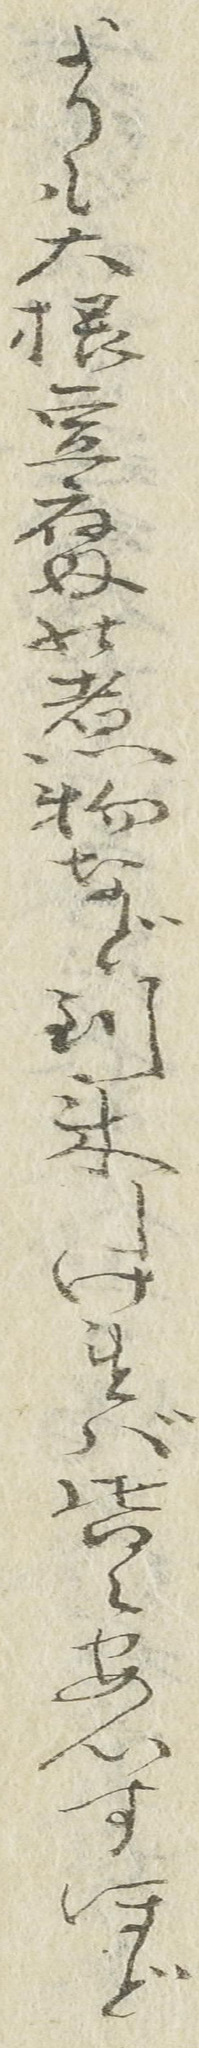よりも大根豆腐の煮物など到来しけれバ皆々安心すほど
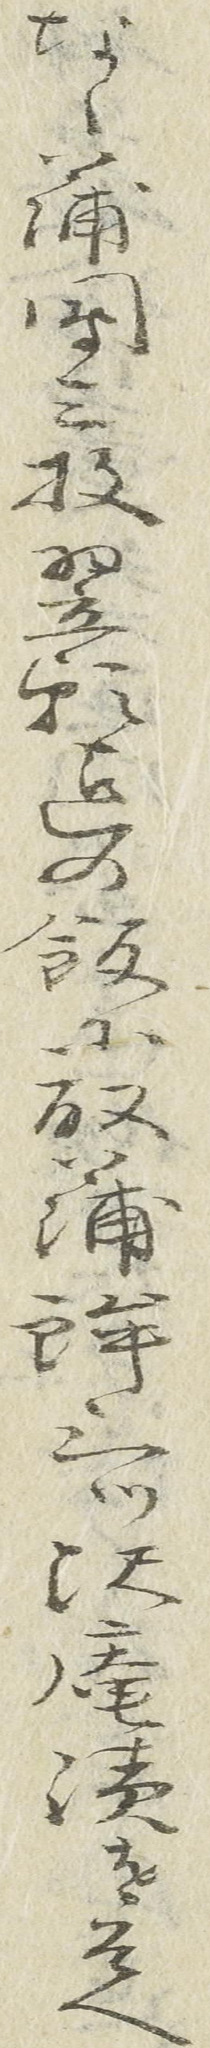なく蒲団三枚翌朝迄の飯に取蒲鉾三ツ沢庵漬をそへ
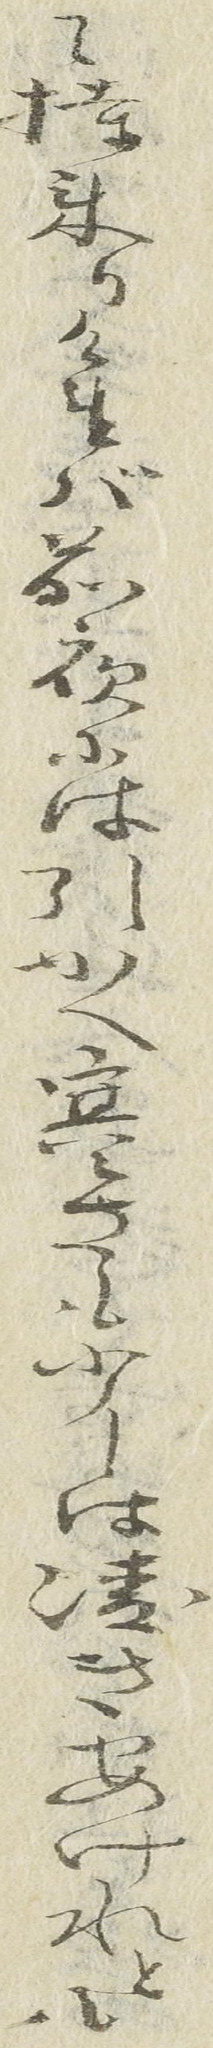て持来りけれバ前夜には引かへ寒さも少しは凌き安けれとも
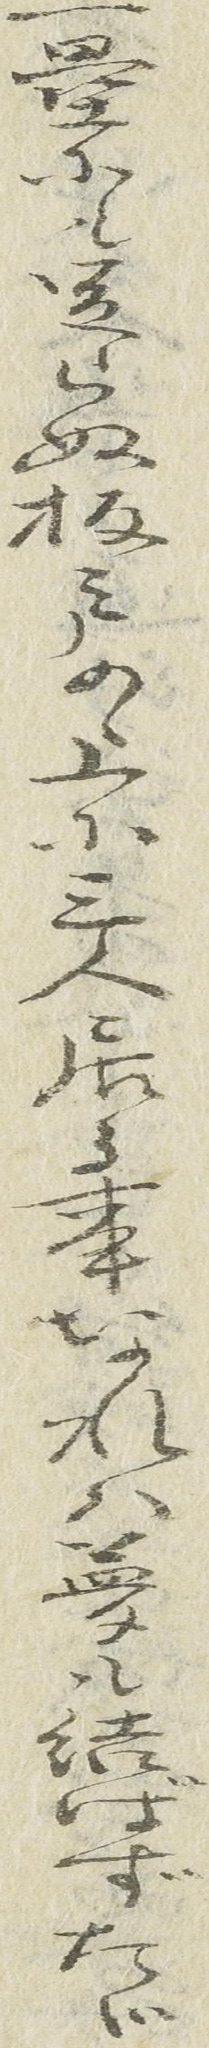一畳にも足らぬ板戸の上に三人居る事なれハ夢も結ばずたゞ
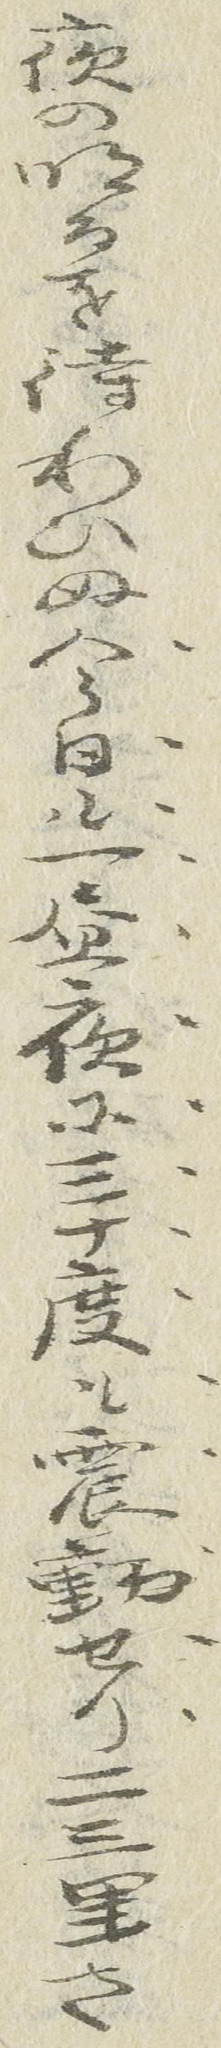夜の明るを待わひぬ今日も一昼夜に三十度も震動せり二三里さ
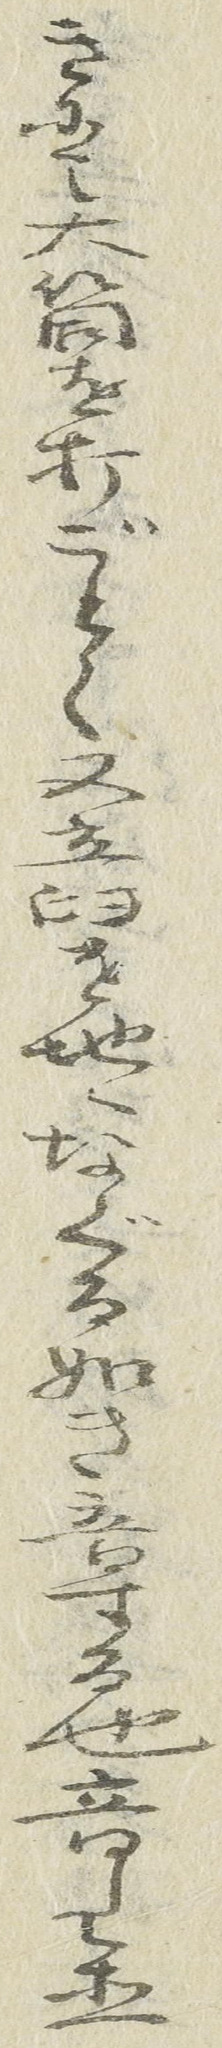きにて大筒を打ごとく又立臼を地へなぐる如き音する也音して直
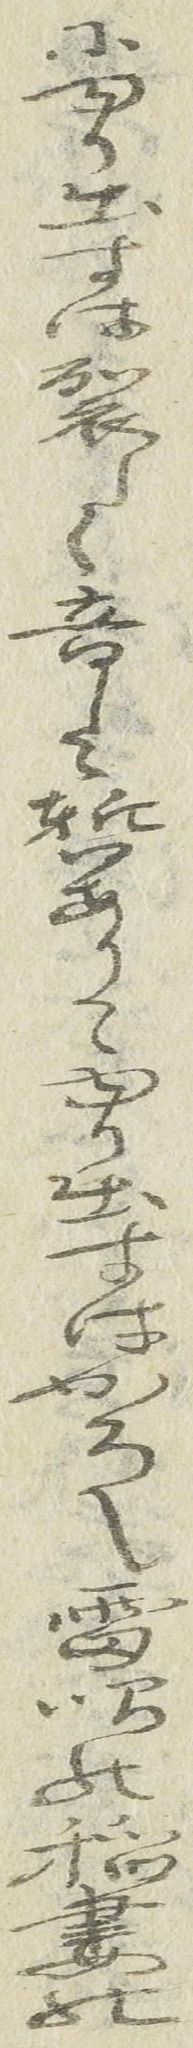にゆり出すは裂しく音して暫ありてゆり出すはかろし雷鳴の稲妻の
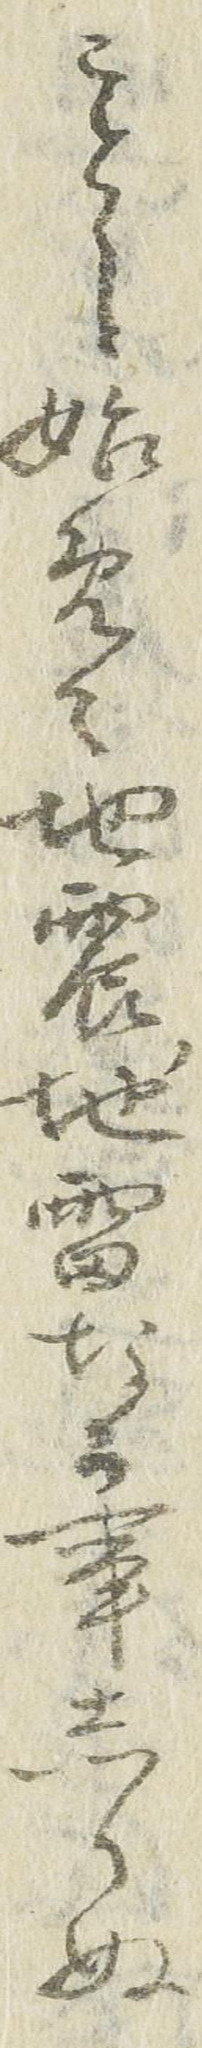ことく始めて地震ハ地雷なる事しりぬ

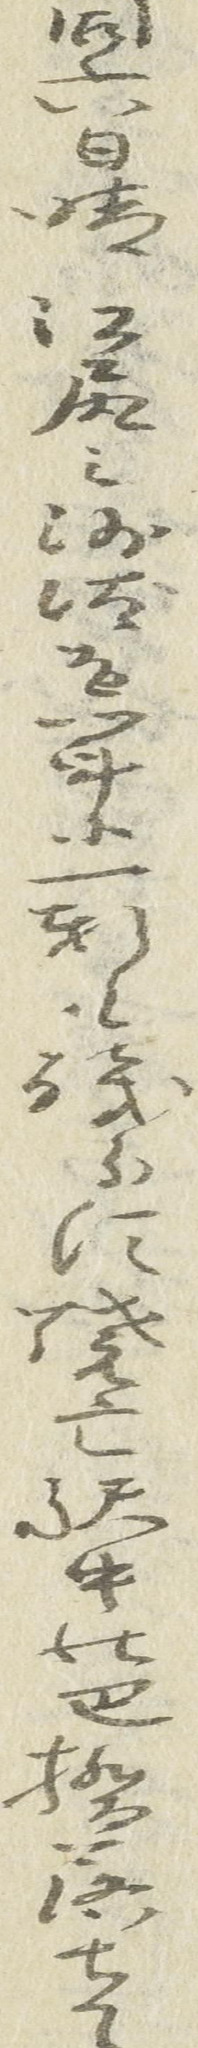同六日晴江尻之沙汰を聞に一軒も残らす焼亡駅中の巴橋落ちて
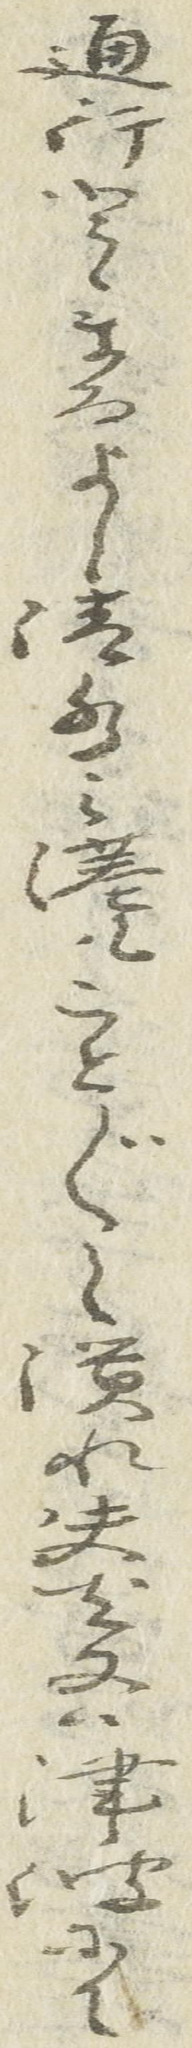通行とゝまるよし清水の港もこと〴〵く潰れ失火又は津波にて
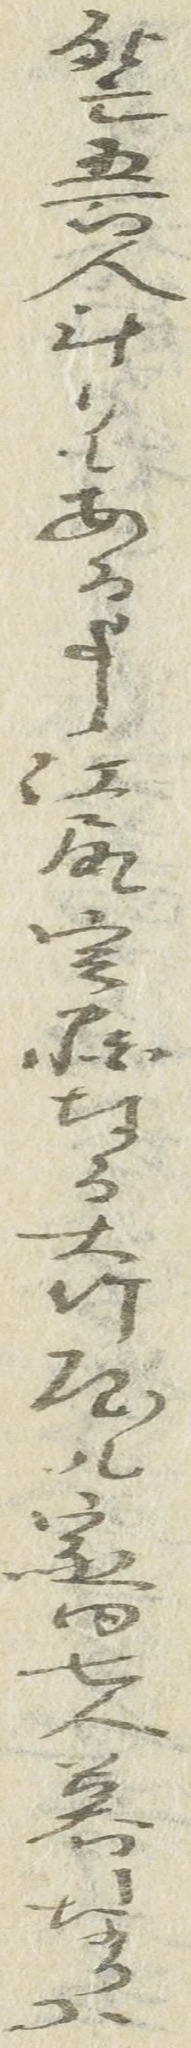死亡五百人斗りもあるよし江尻定宿なる大竹屋も家内七人暮しなるに
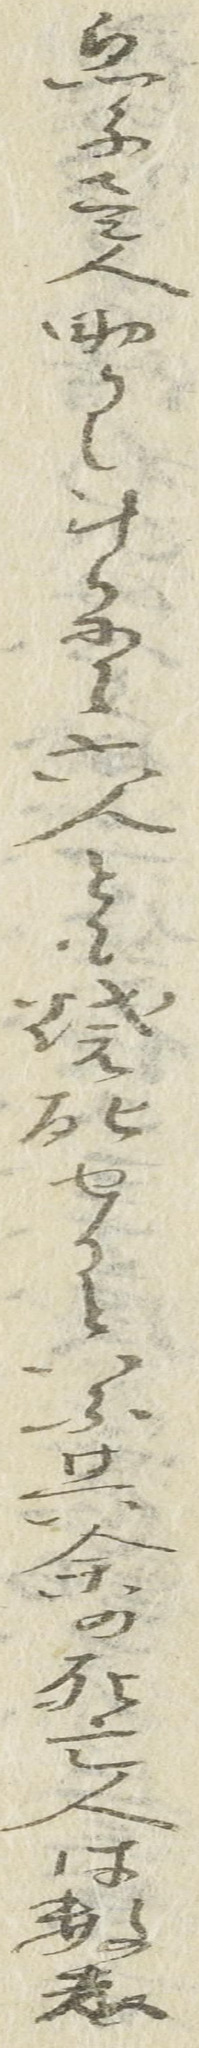息子壱人助りし斗りにて六人とも焼死せりといふ其余の死亡人は数し
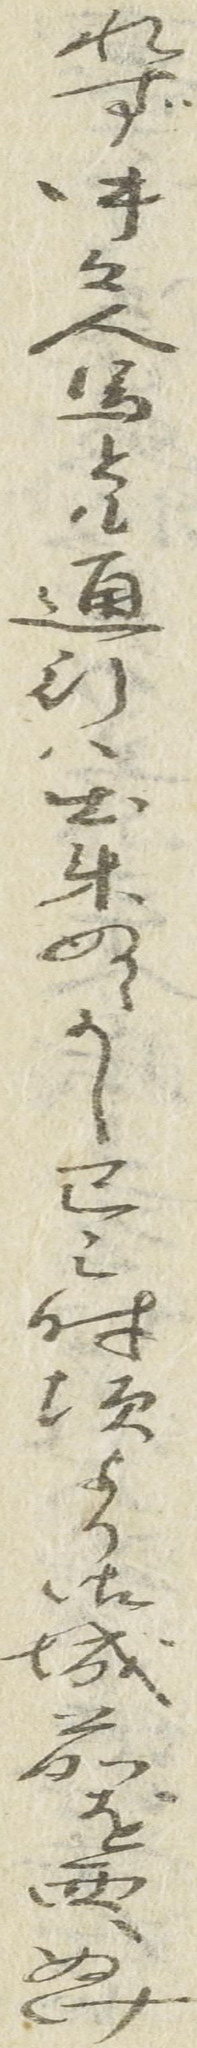れず中々人馬とも通行は出来ぬよし己之時頃より御城前を西へぬけ
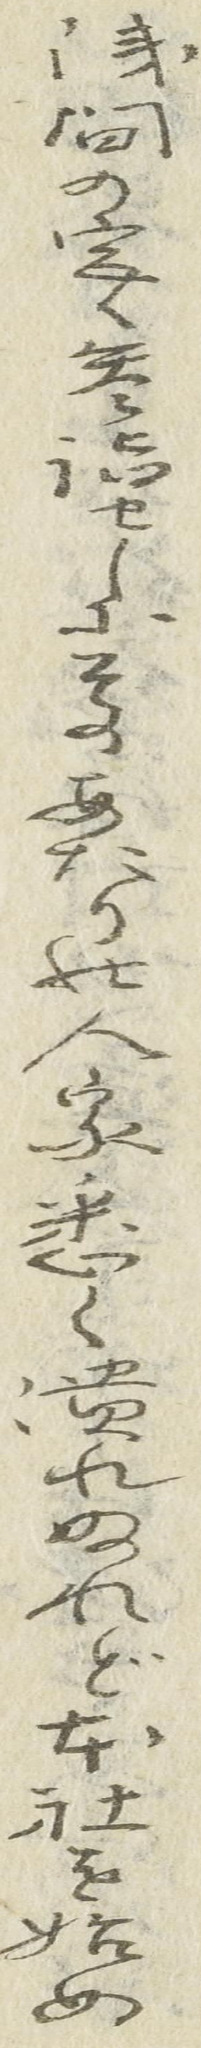浅間の宮へ参詣せしにそのあたりの人家悉く潰れぬれど本社を始め
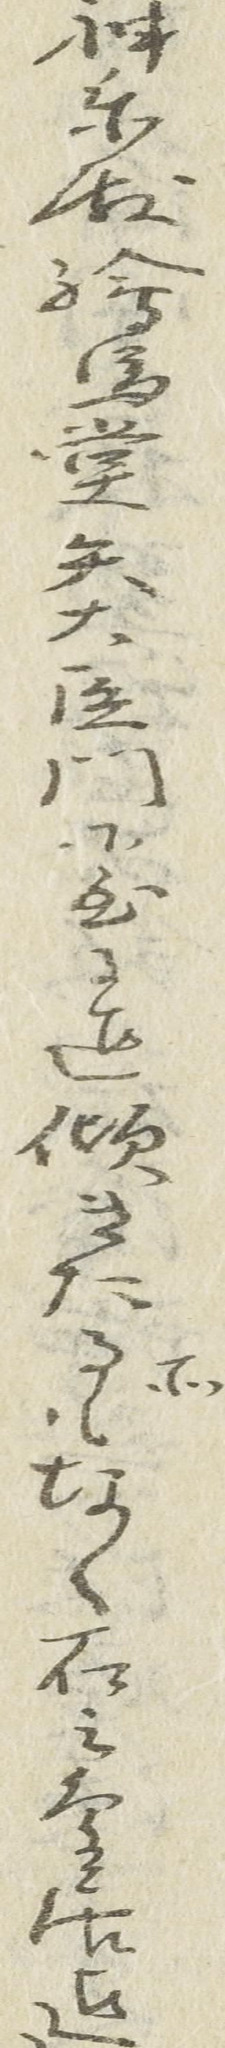神楽殿絵馬堂矢大臣門に至る迄傾きたるもなく石の鳥居迄も
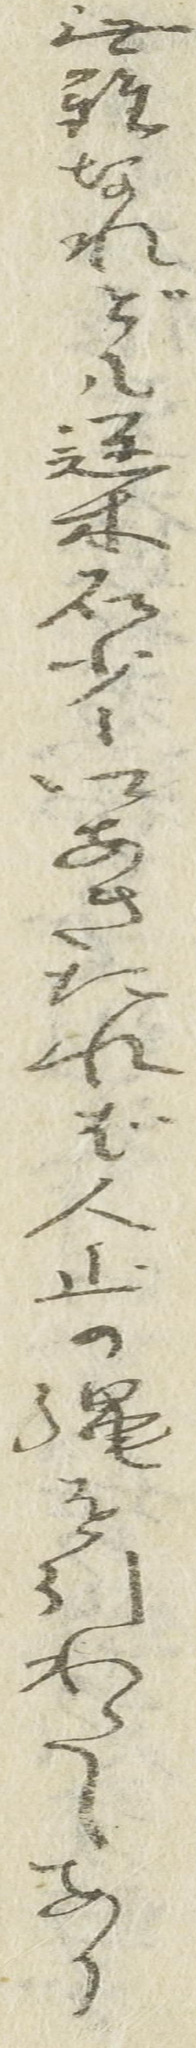無難なれども迷木石少し口あきたれば人止の縄を引わたしあり
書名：地震前兆集　全
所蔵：東京大学地震研究所図書室 Earthquake Research Institute Library, The University of Tokyo, JAPAN
